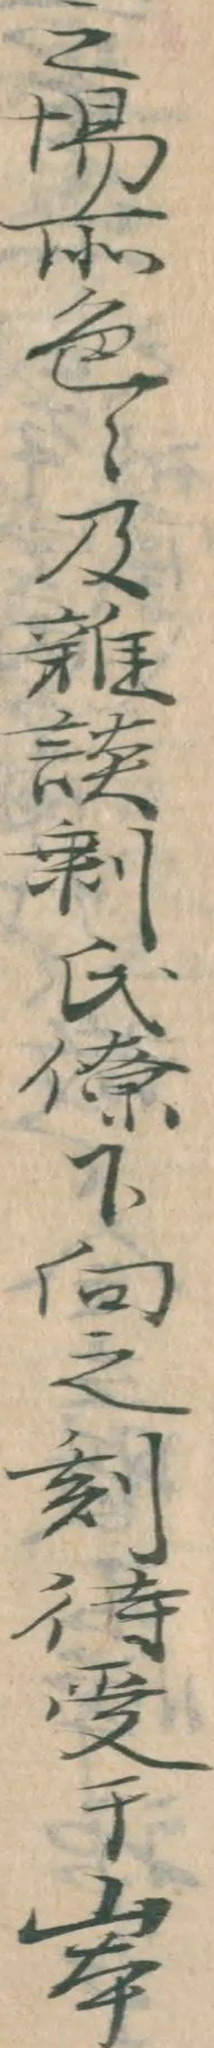之場所色々及雑談剰氏僚下向之刻待受于山本
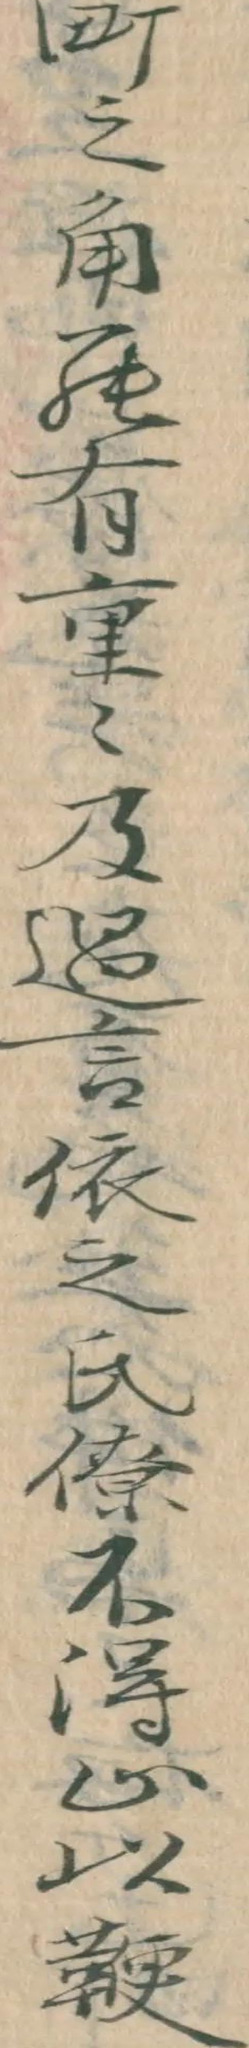町之角罷有重々及過言依之氏僚不得止以鞭
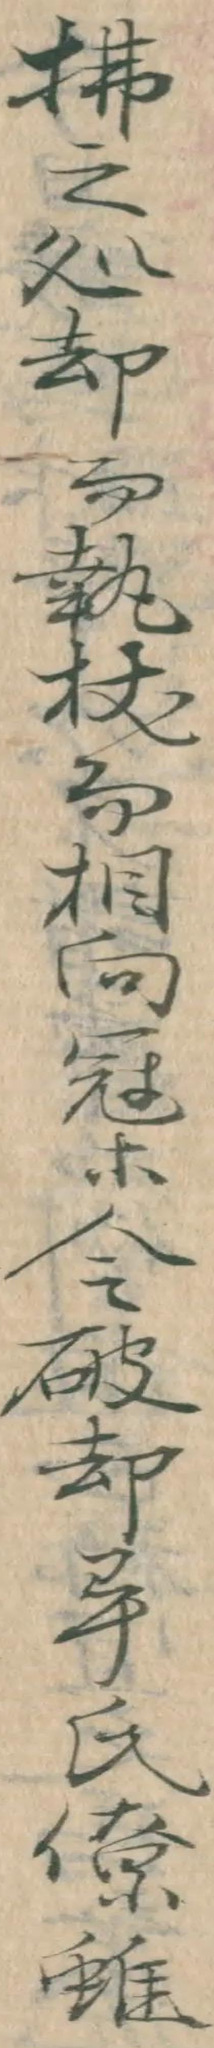払之処却而執杖而相向冠等令破却畢氏僚雖
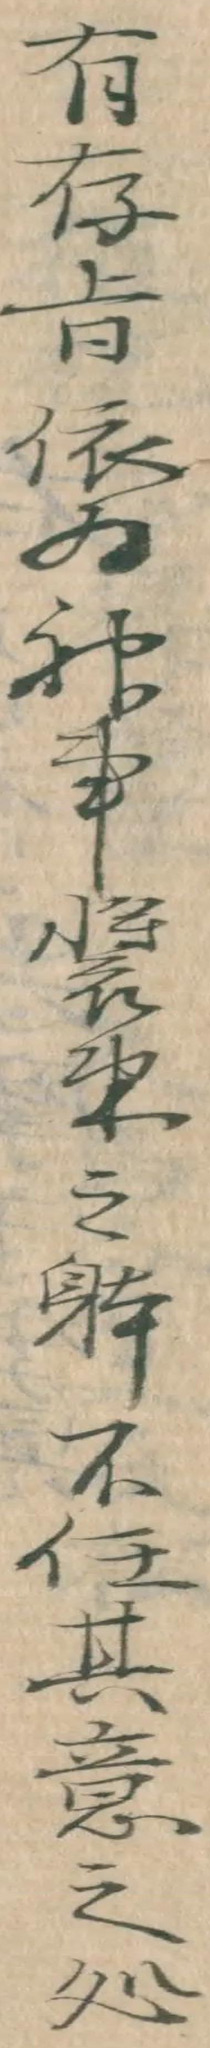有存旨依為神事装束之体不任其意之処
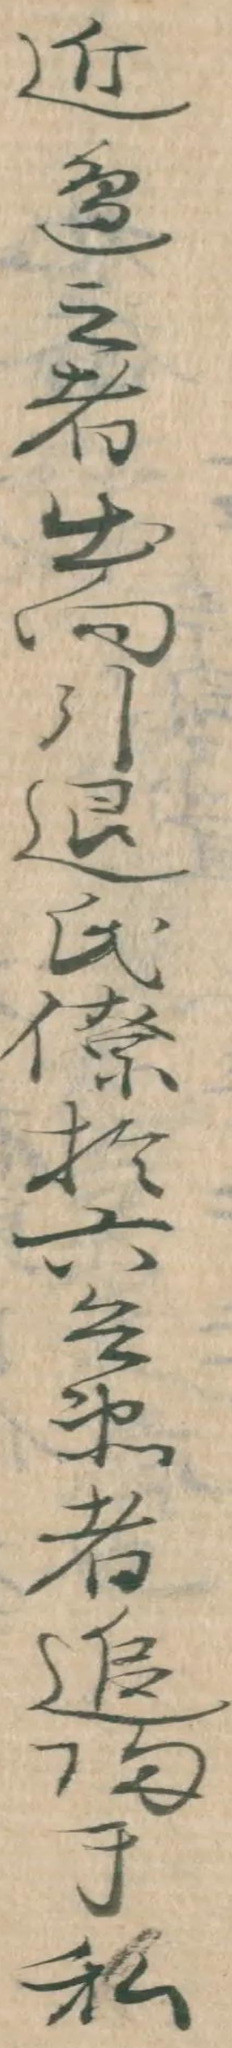近辺之者出向引退氏僚於六兵衛者追帰于私
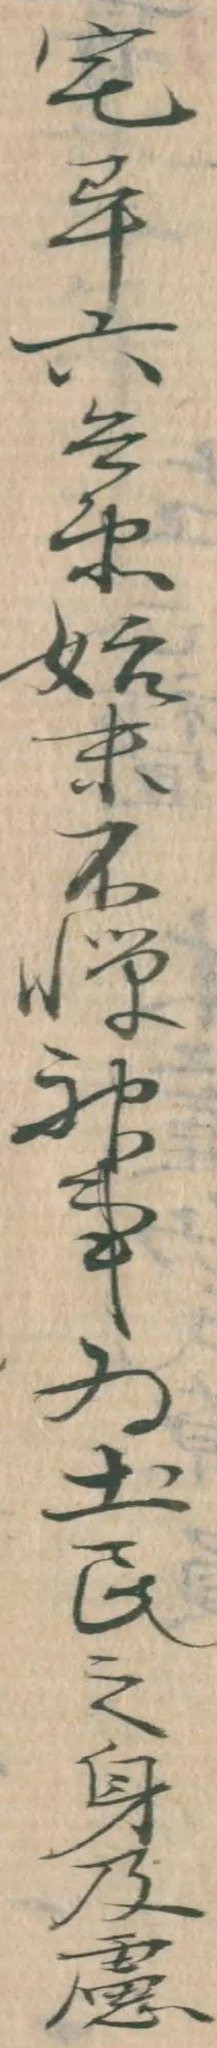宅畢六兵衛始末不憚神事為土民之身及慮
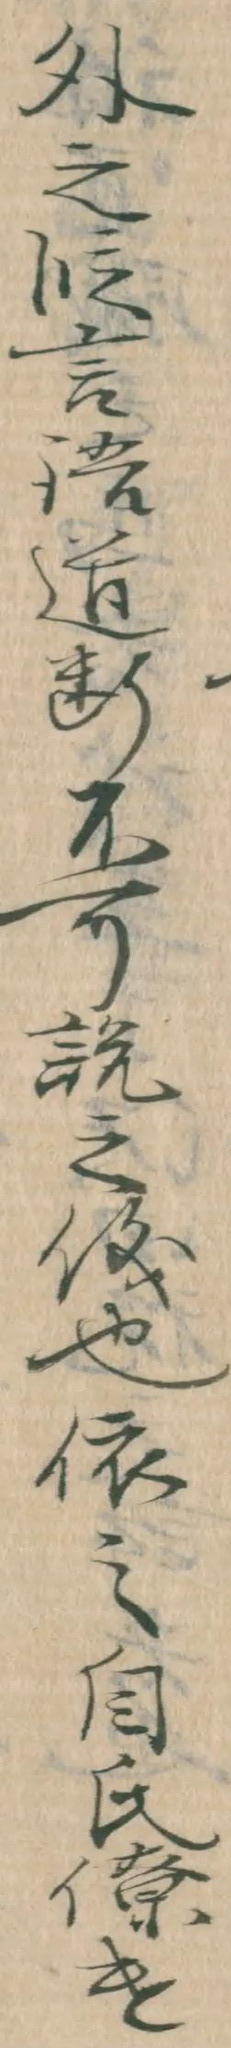外之段言語道断不可説之儀也依之自氏僚遣
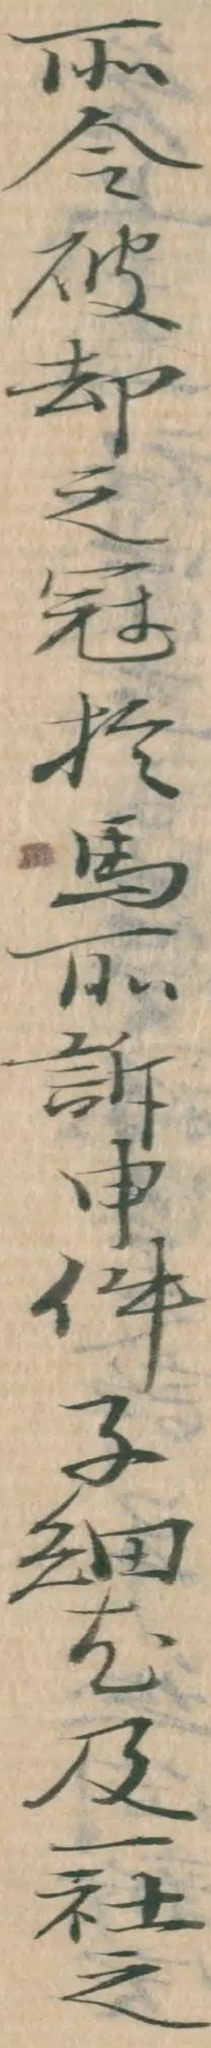所令破却之冠於馬所訴申件子細尤及一社之
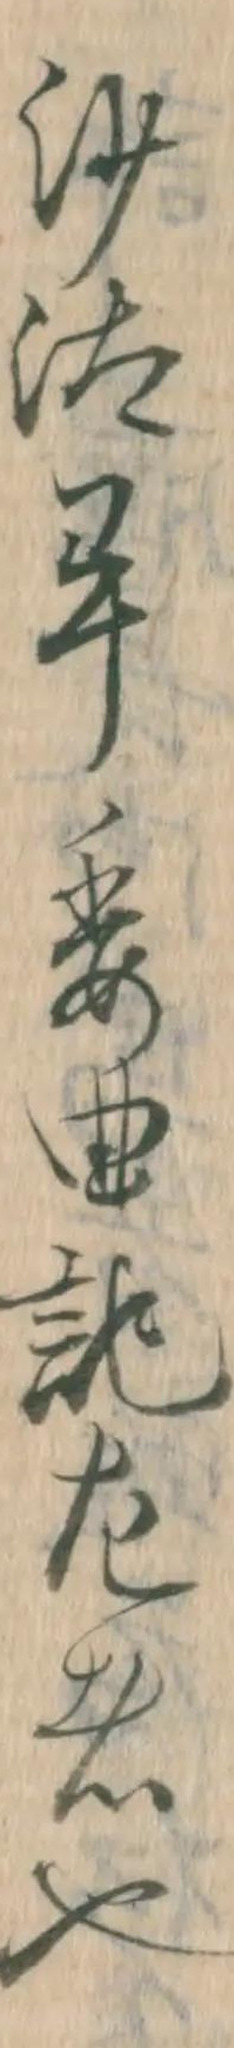沙汰畢委曲記左者也
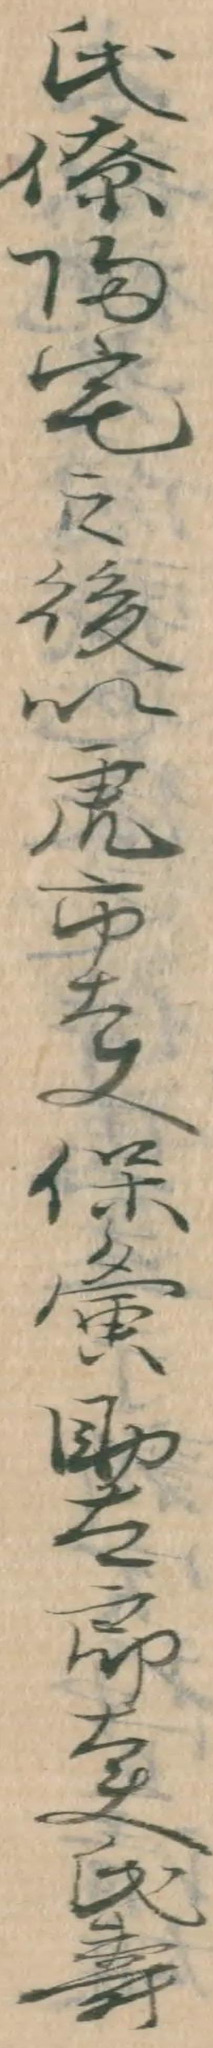氏僚帰宅之後以虎市大夫保寅助太郎大夫氏寿
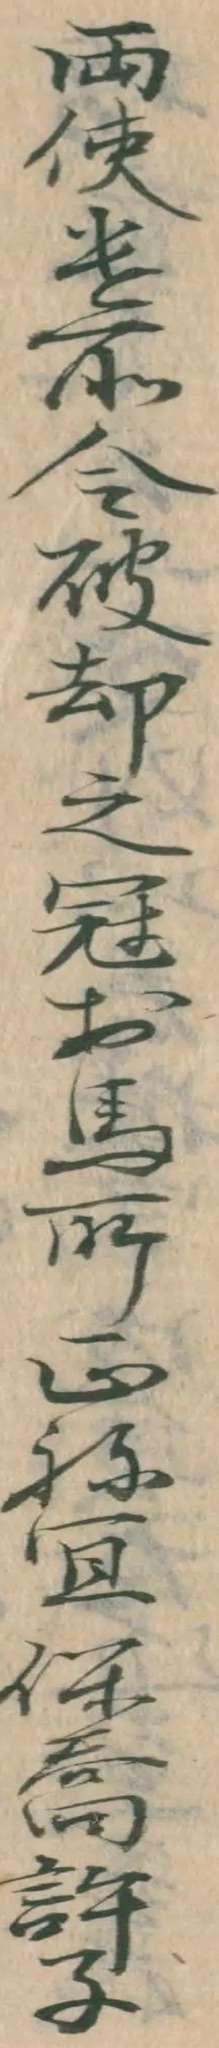両使遣所令破却之冠於馬所正祢宜保喬許子
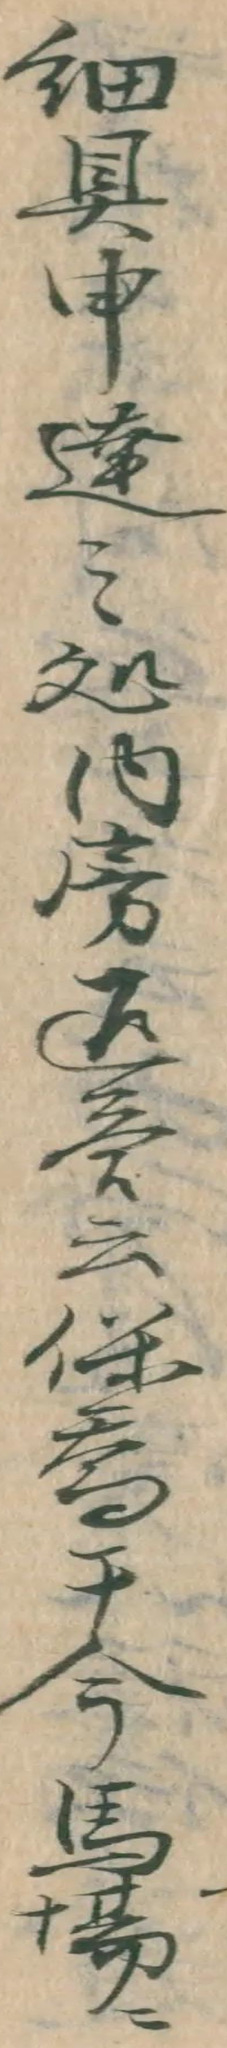細具申達之処内房返答云保喬于今馬場ニ
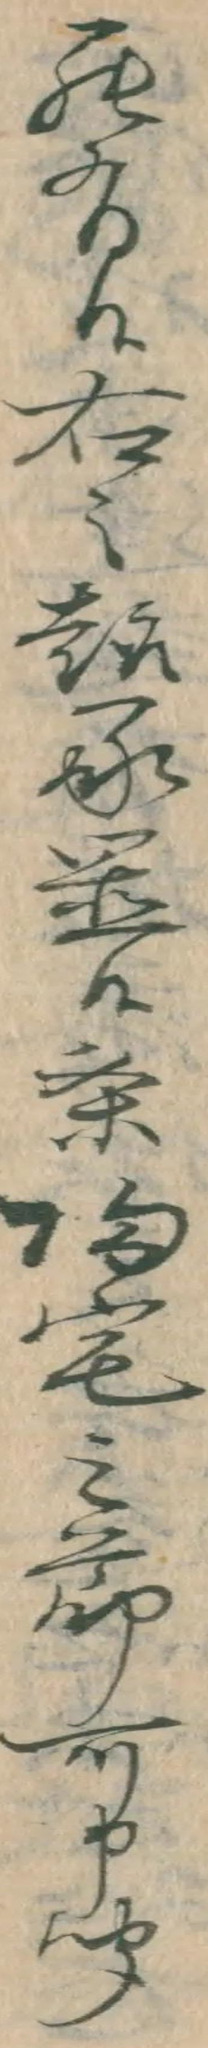罷有候右之趣承置候条帰宅之節可申聞
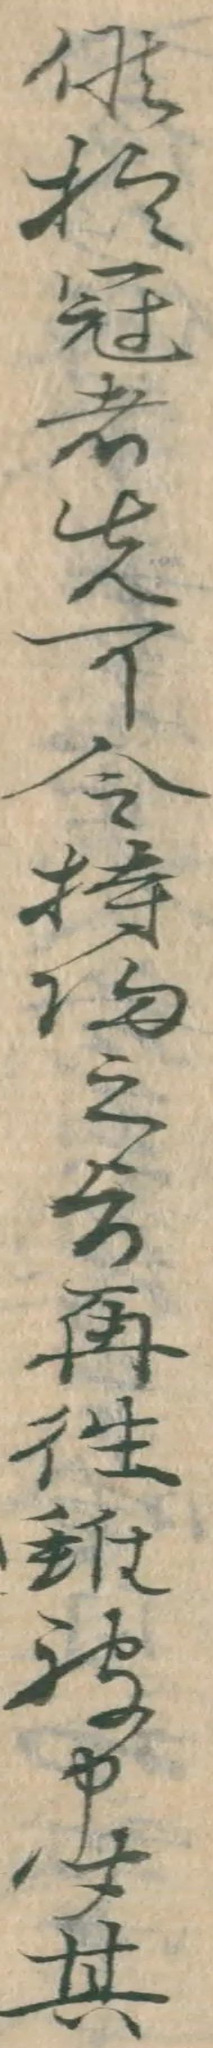候於冠者先可令持帰之旨再往雖被申聞其
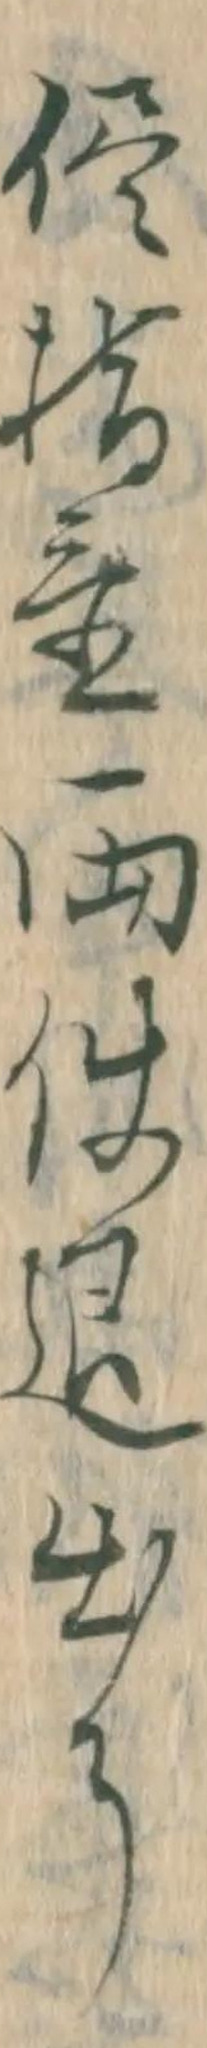侭指置両使退出了
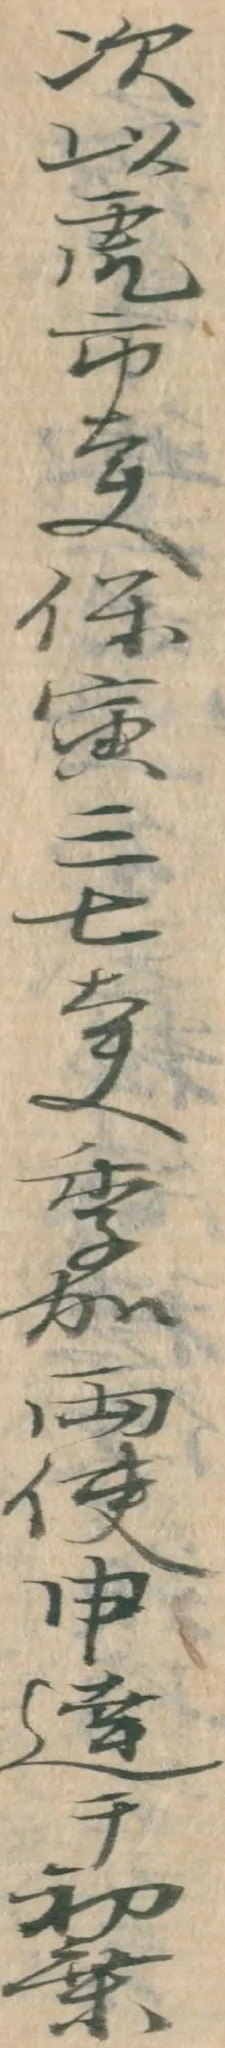次以虎市大夫保寅三七大夫季加両使申達テ初乗
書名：賀茂社記録. 第10冊
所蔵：国立国会図書館 National Diet Library, JAPAN
